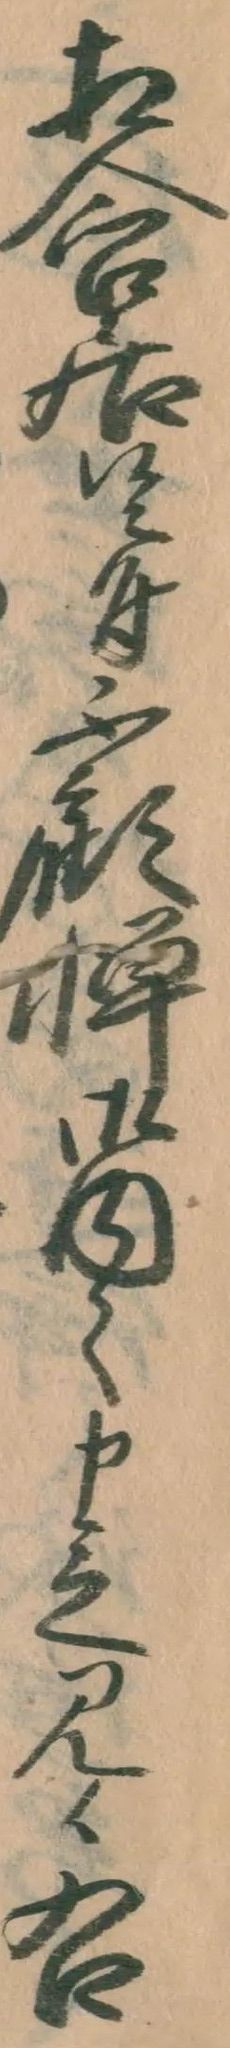相含居候ニ付不顧憚御内之申立見候右
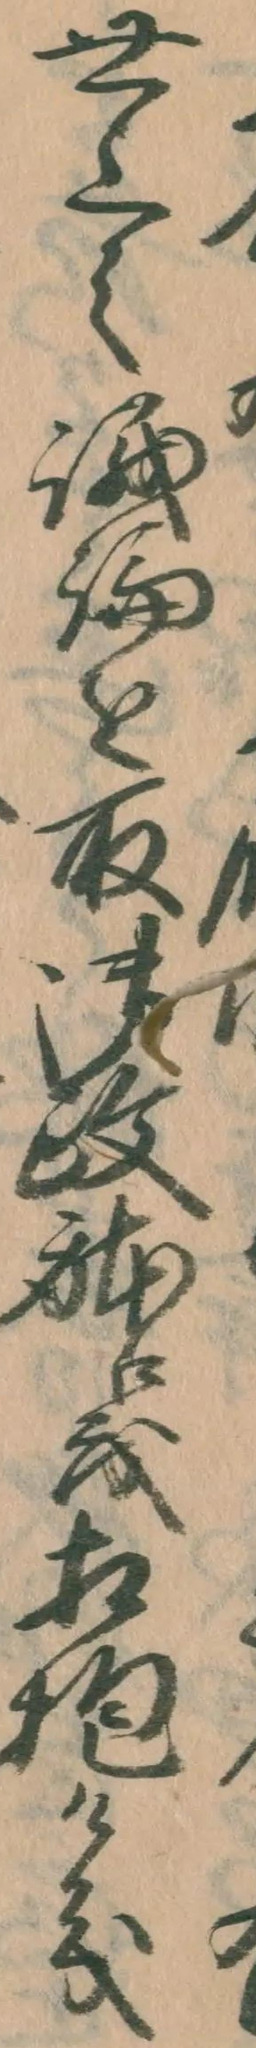世上之議論を取御政体えも相抱候義
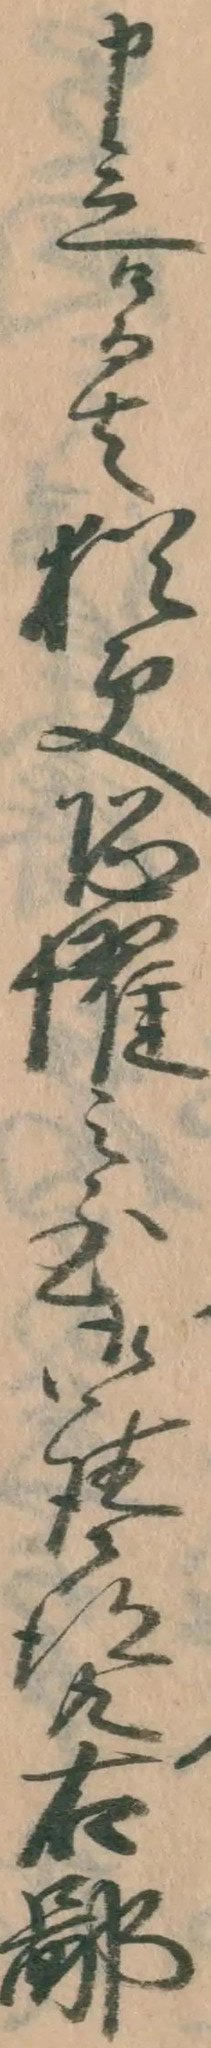申立候而者猶更恐懼之至御座候得共右鄙
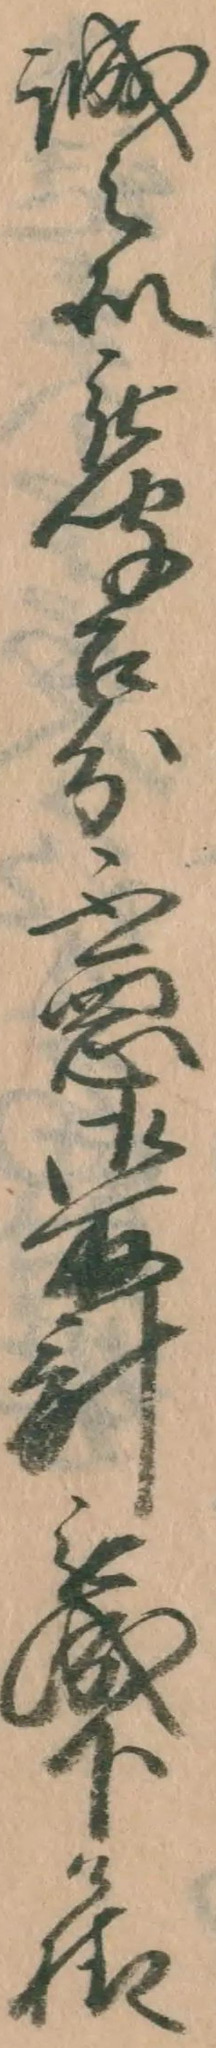誠之処被聞召分不悪御取計被成下候様
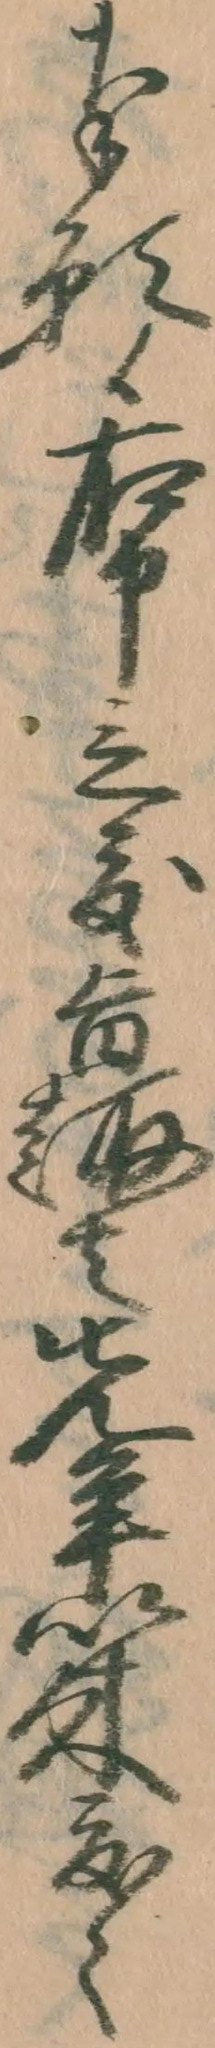奉願候右申立度旨趣者先年以来度ゝ
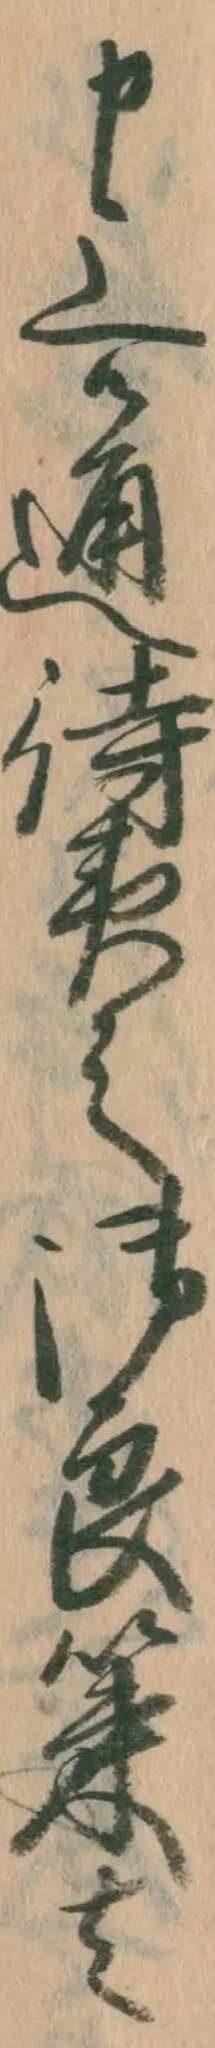申上候通待夷之御良策者
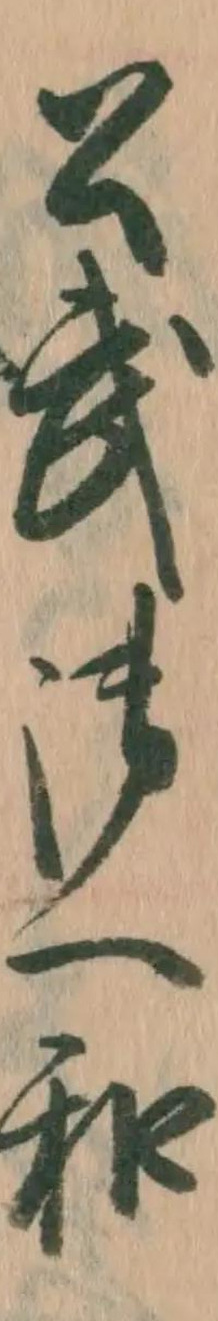公武御一和
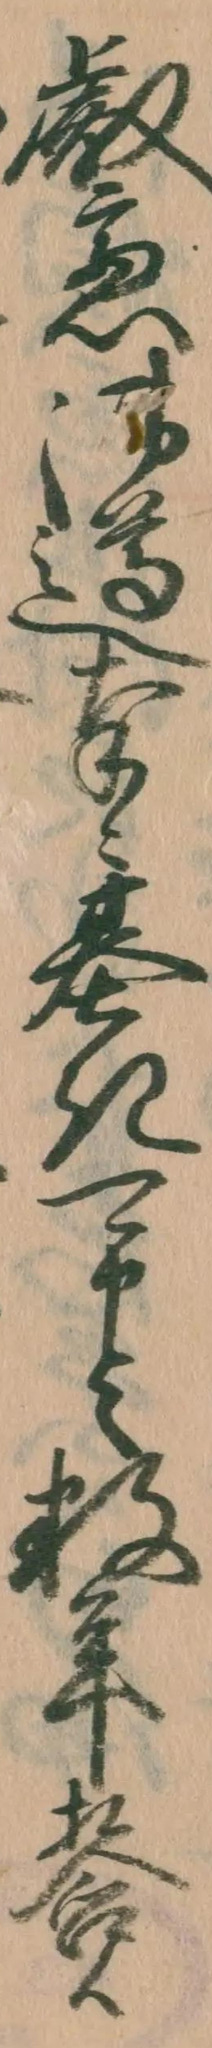叡慮御遵奉ニ基き可申と数年相含候
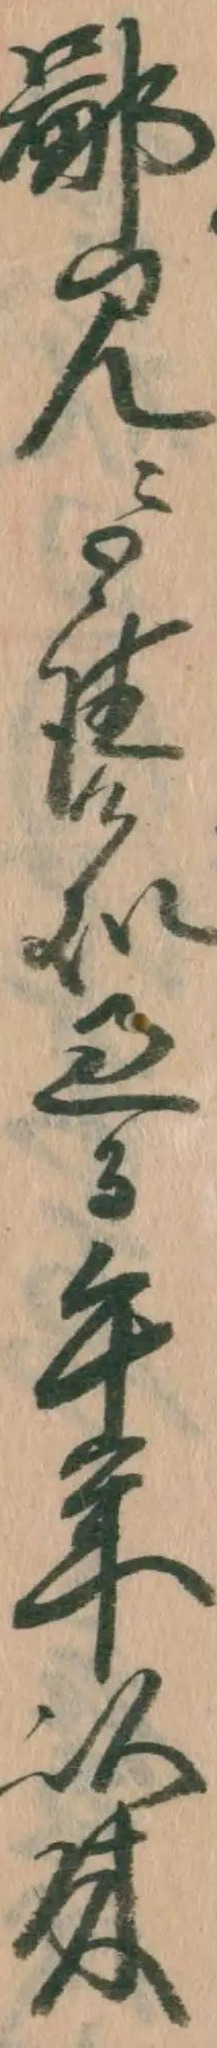鄙見ニ御座候過る午年以来
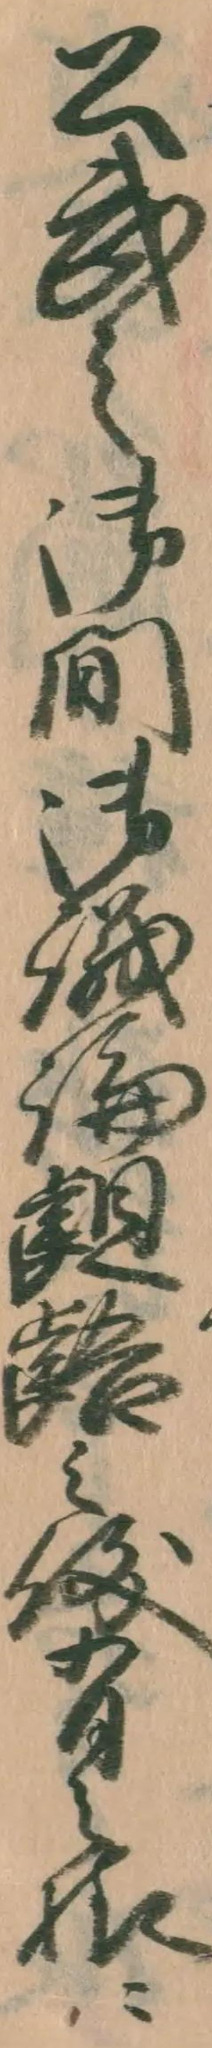公武之御間御議論齟齬之儀有之様ニ
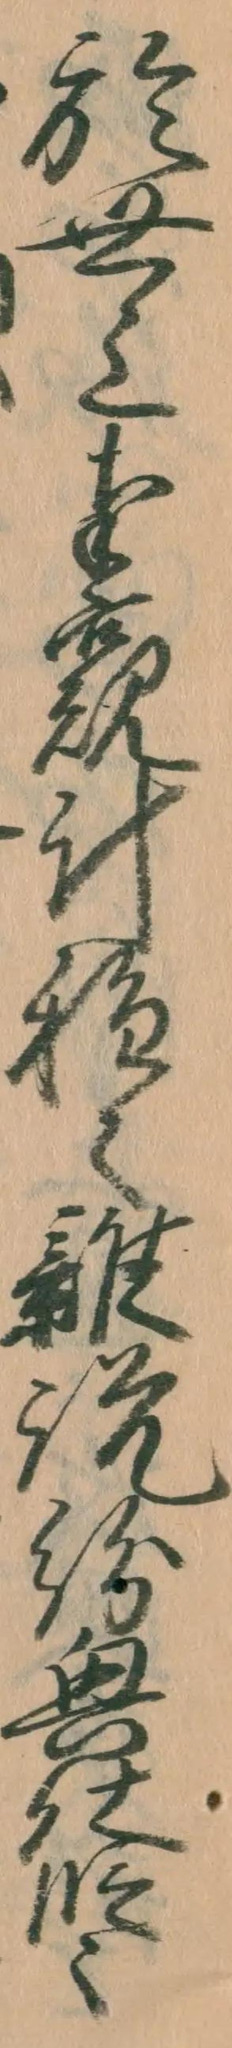於世上奉窺計種ゝ雑説紛興仕段々
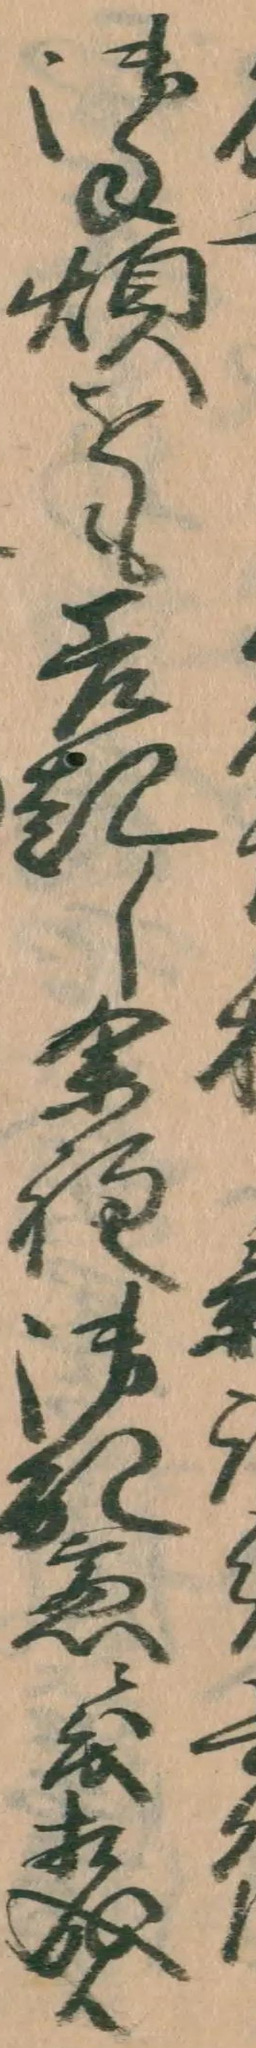御手煩をも差起し余程御配慮ニも相成候
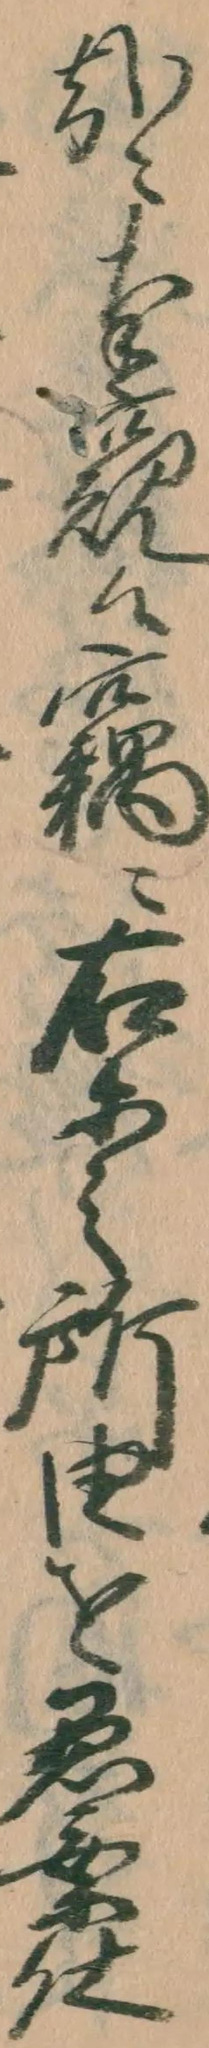哉ニ奉窺候竊ニ右等之所由を愚案仕
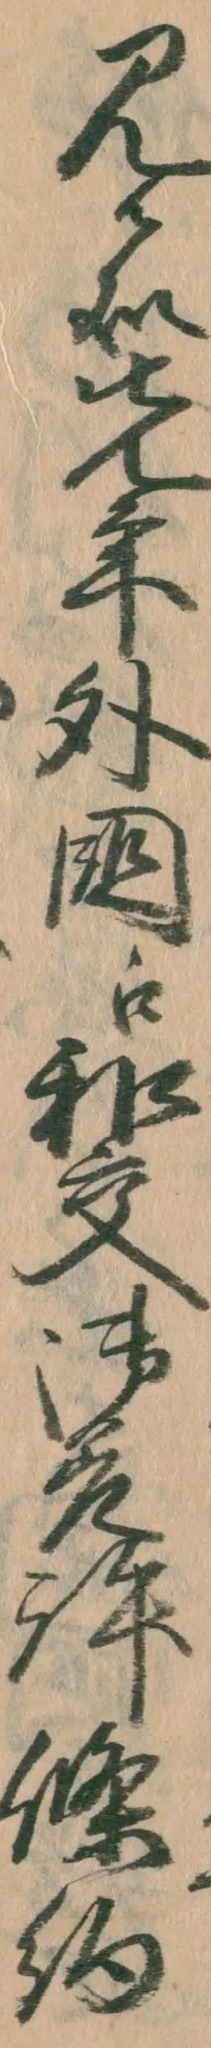見候処先年外国え和交御差許條約
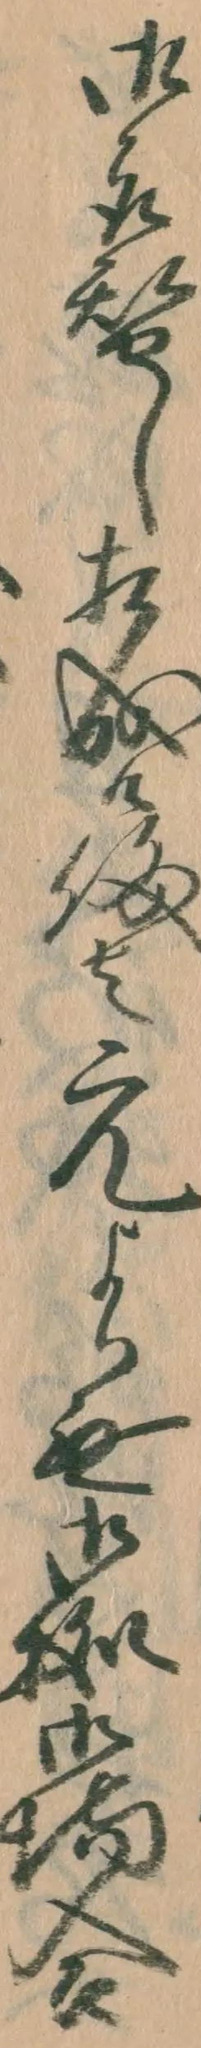御取替し相成候儀者元より無御拠御場合
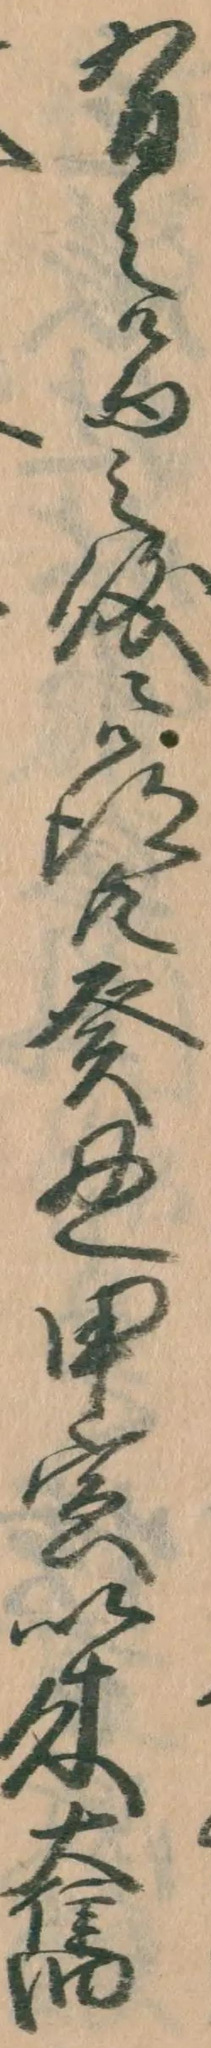有之候而之儀ニ候得共癸丑甲寅以来奮
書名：麗斎叢書. 20
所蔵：国立国会図書館 National Diet Library, JAPAN
